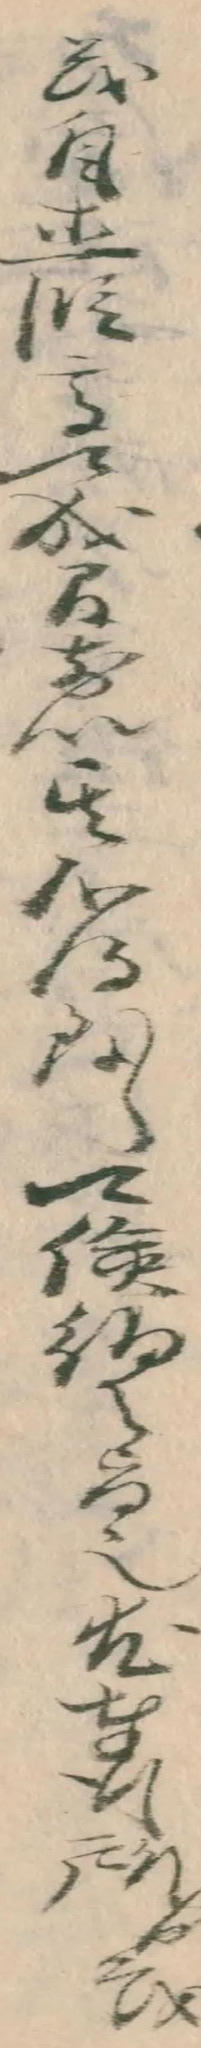も自直段高可成間前以其心得致し可倹約之旨也尤奉行所ゟも
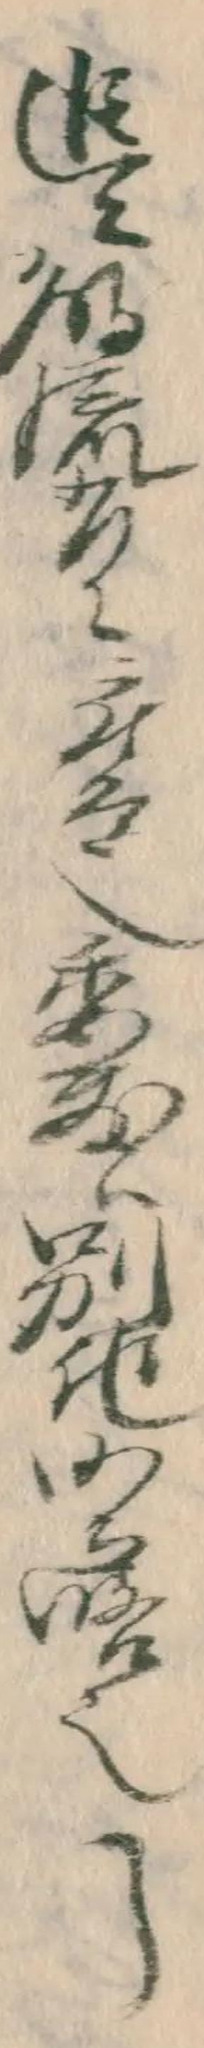追々觸流有之ニ付而也委敷ハ別記仍而略也了
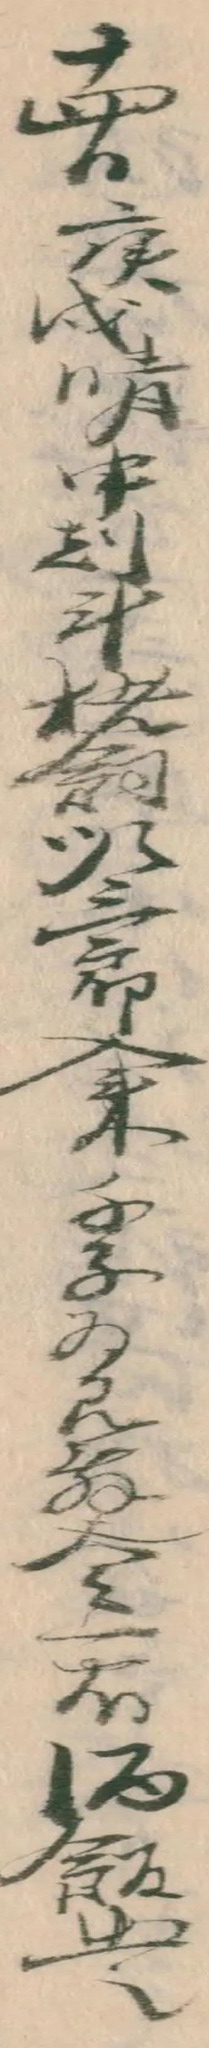十四日庚戌明中刻斗猪飼順三郎入来千子為見舞令一肴酒飯出也
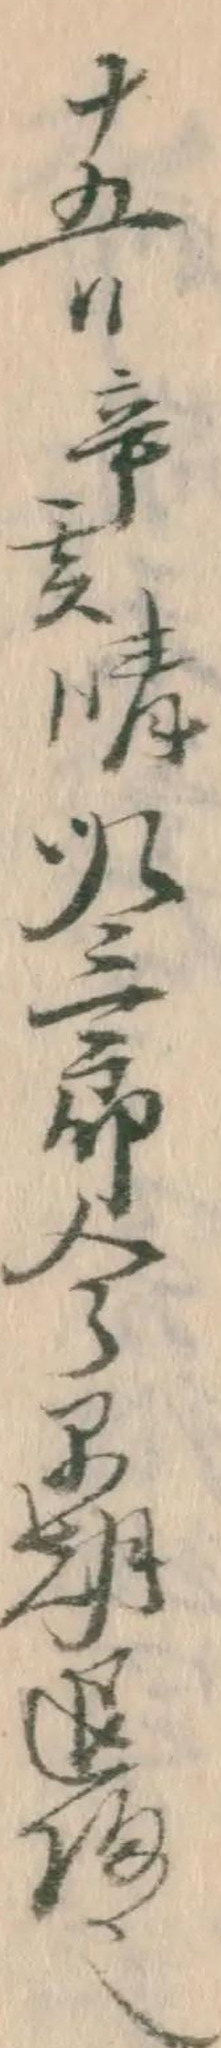十五日辛亥晴順三郎今早朝退帰也
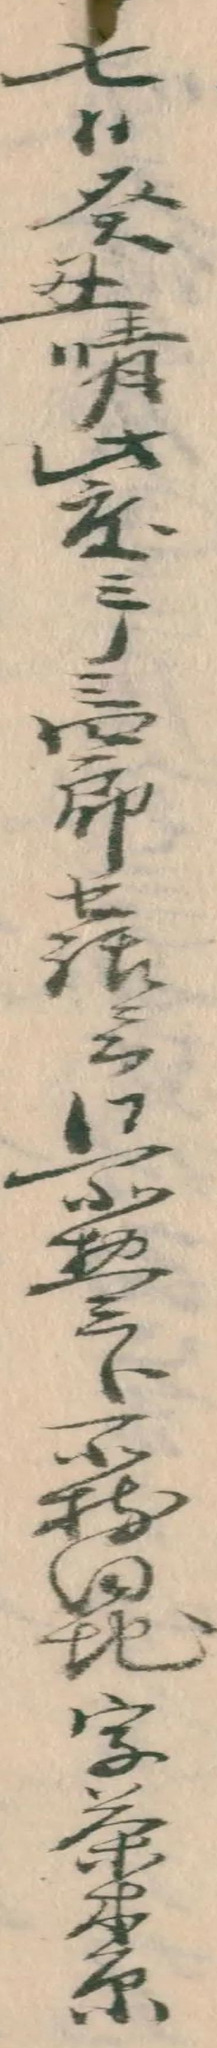十七日癸丑晴此度三ノ三四郎世話ニ而同所惣三郎所持田地字茶木原
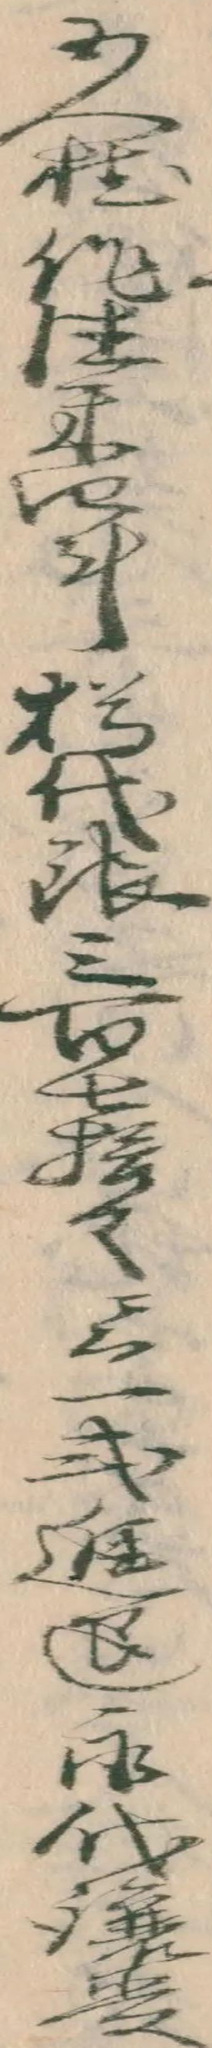五人程作植米四斗樽代銀三百七拾匁ニ而一弐進退永代譲受
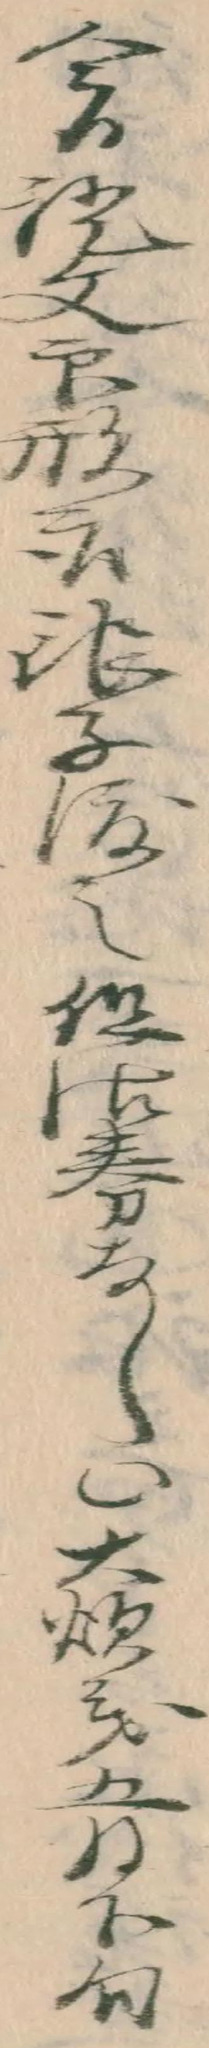今日證文印形取銀子渡也但沽券なし◯大炊義五月下旬
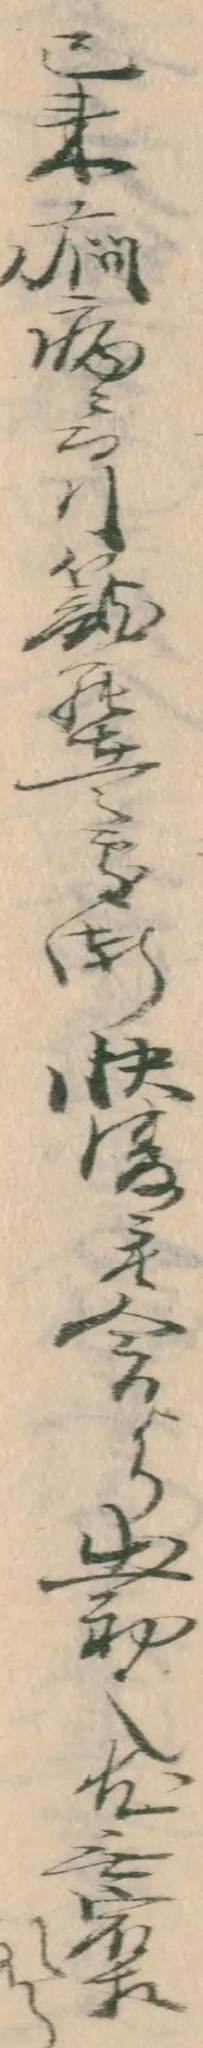已来癇病ニ而引籠罷在候之處漸快復ニ付今より出勤也尤無宿相願了
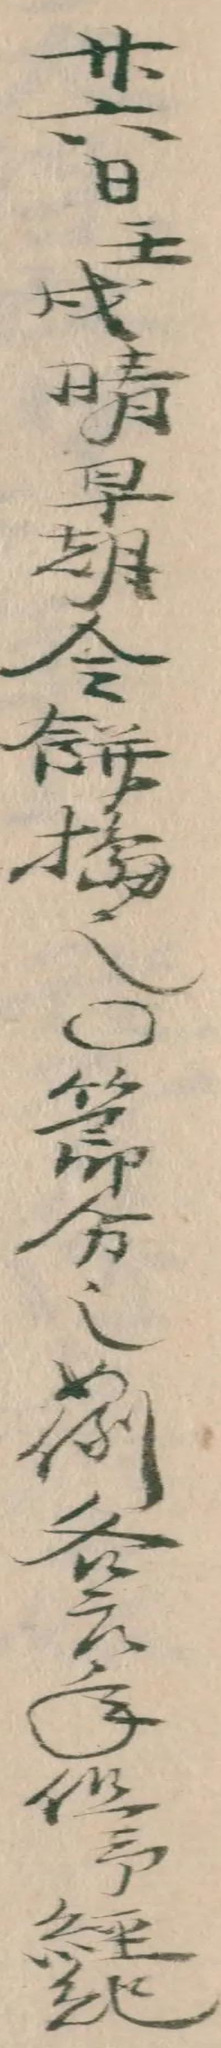廿六日壬戌晴早朝令餅搗也○節分之如例各充年但予経紀
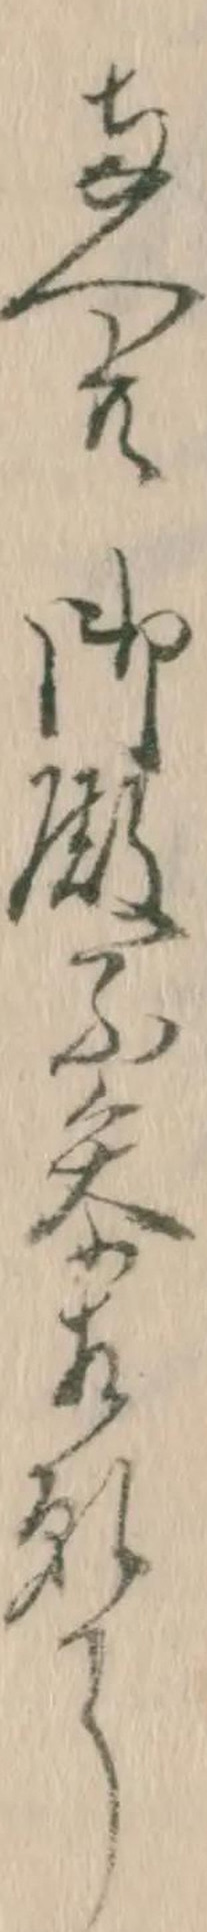両人共御殿不参相願了
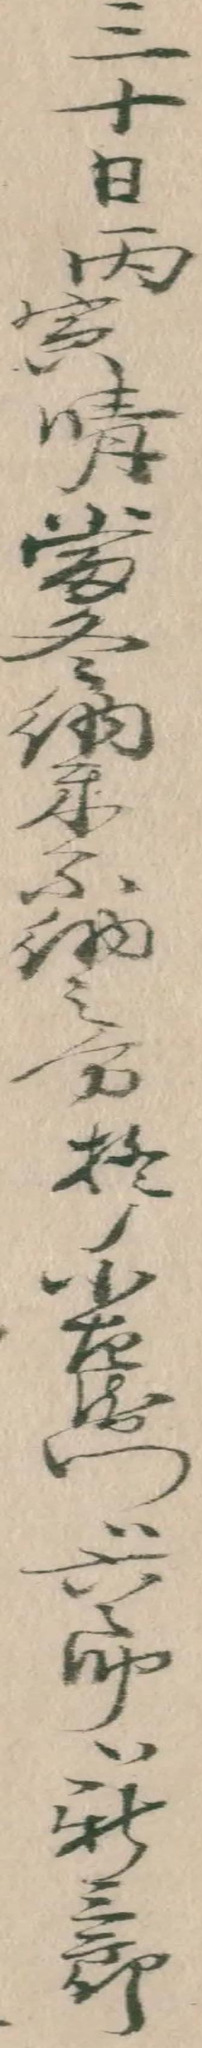三十日丙寅晴當冬納米不納之分柊ノ小左衛門同六之助同新三郎
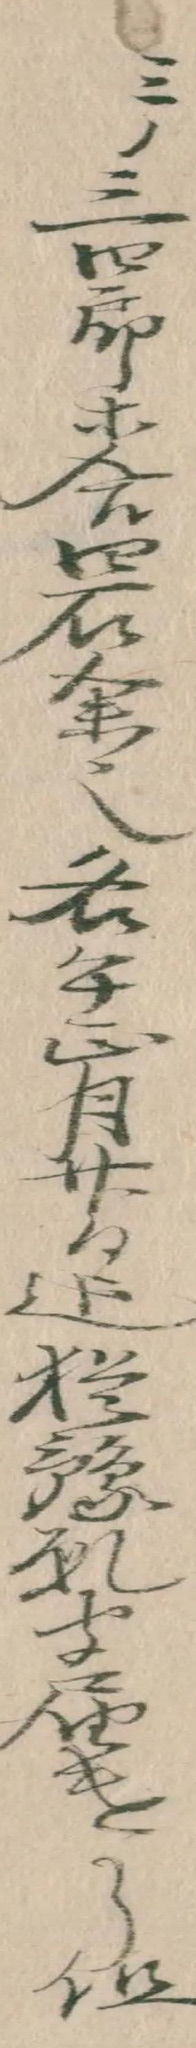三ノ三四郎等合四石余也各午正月廿日迄猶豫願聞届遣了但
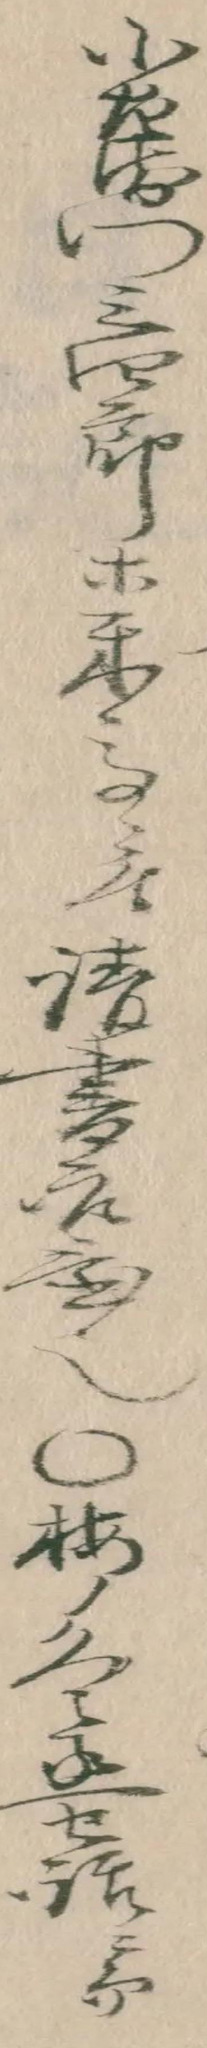小左衛門三四郎等米高ニ付請書取置也〇梅ノ久之丞世話ニ而
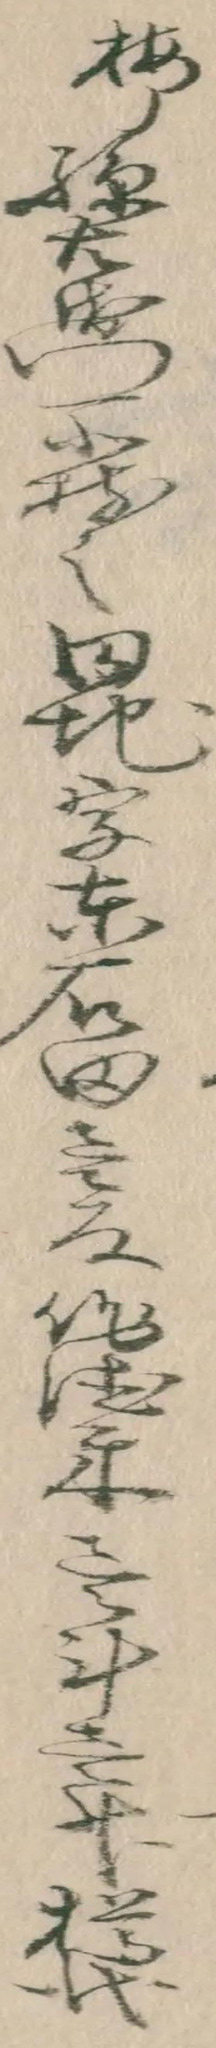梅ノ孫右衛門所持之田地字東石田壱反作徳米壱斗壱升樽代
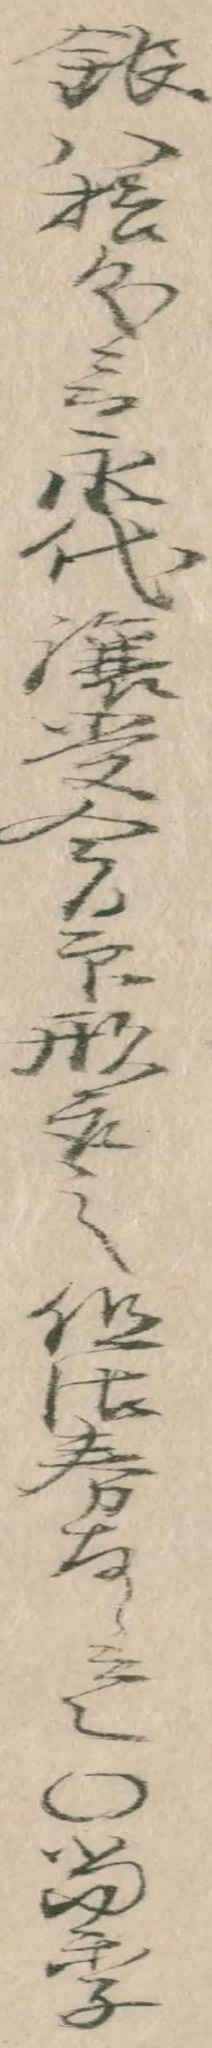銀八拾匁ニ而永代譲受今日印形取也但沽券なし云々〇當季
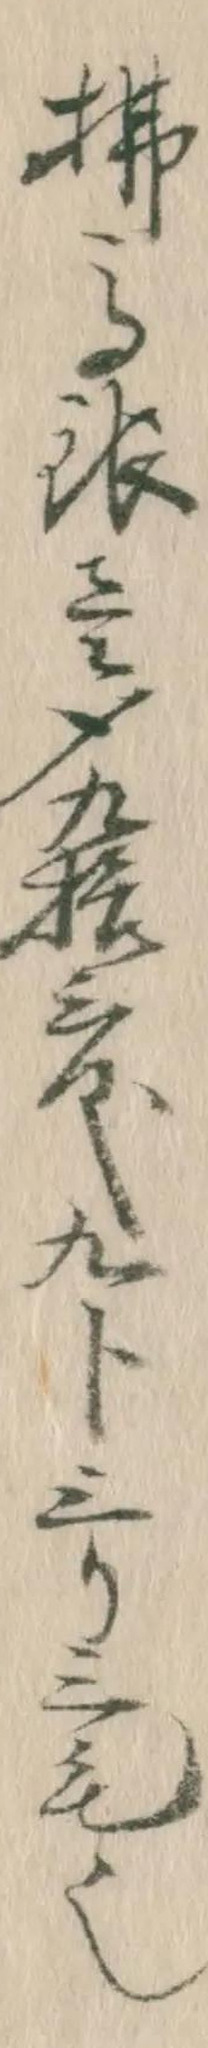払高銀壱〆九拾三匁九分三り三毛也
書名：賀茂社記録. 第66冊
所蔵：国立国会図書館 National Diet Library, JAPAN
